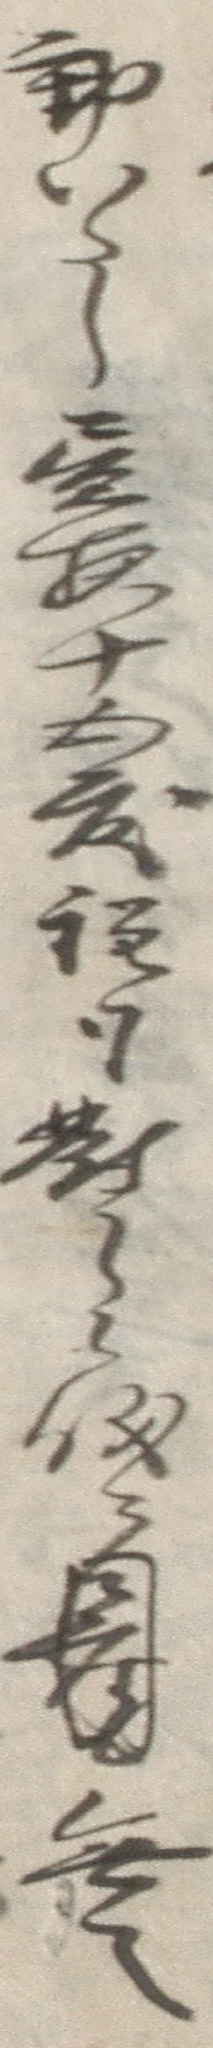動いたし昼夜十五度程ツゝ対し候儀二御座候無之
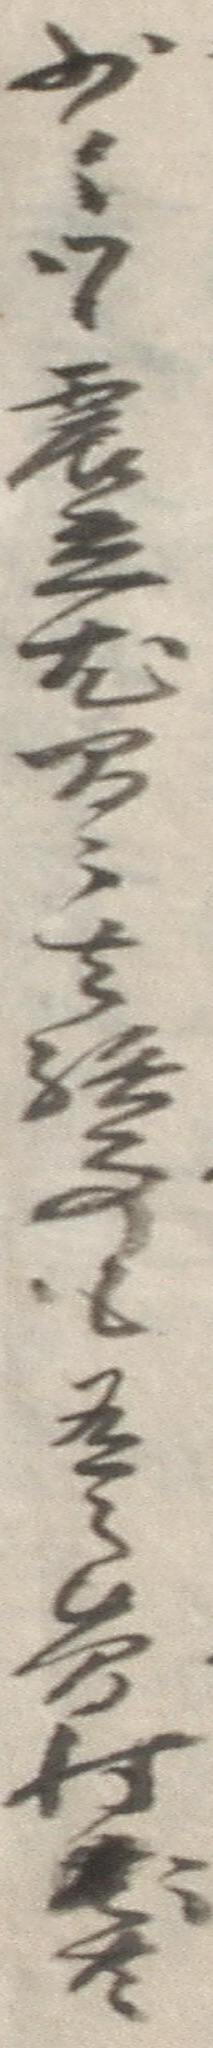少々ツ震立尤間々は強事も有之候間村々共
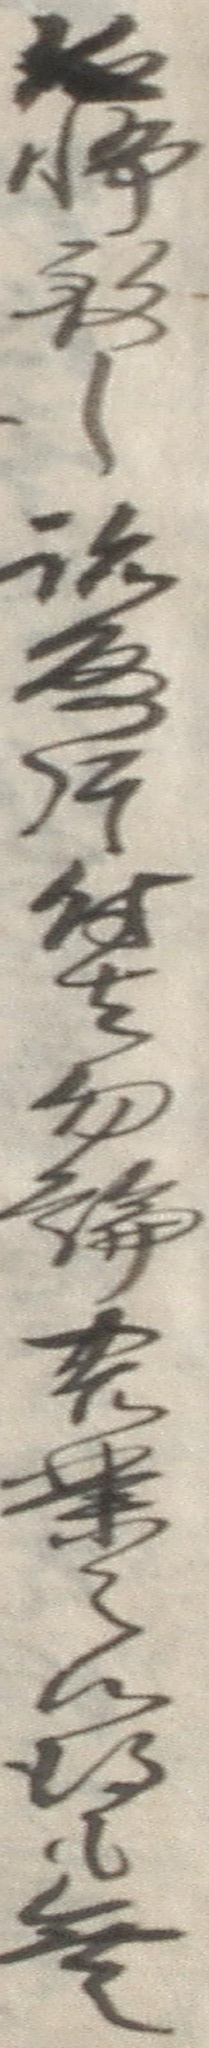恐怖致し跡取片付は勿論家業之心得も無之
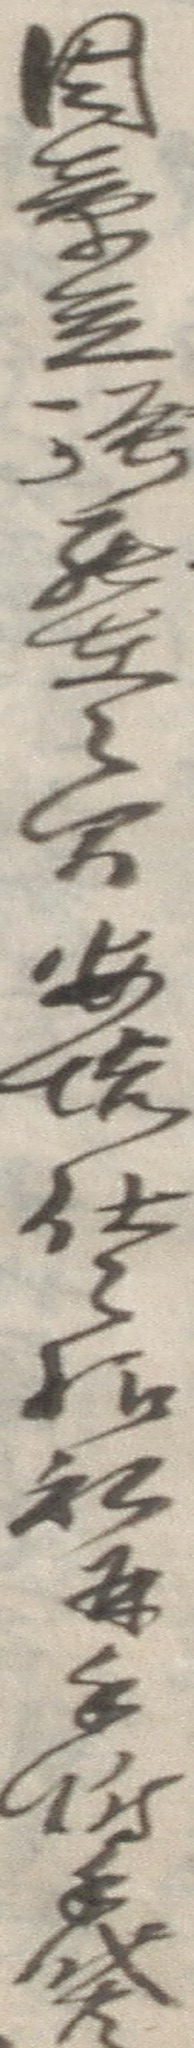周章立騒罷在候間安堵仕候様私并手附手代共
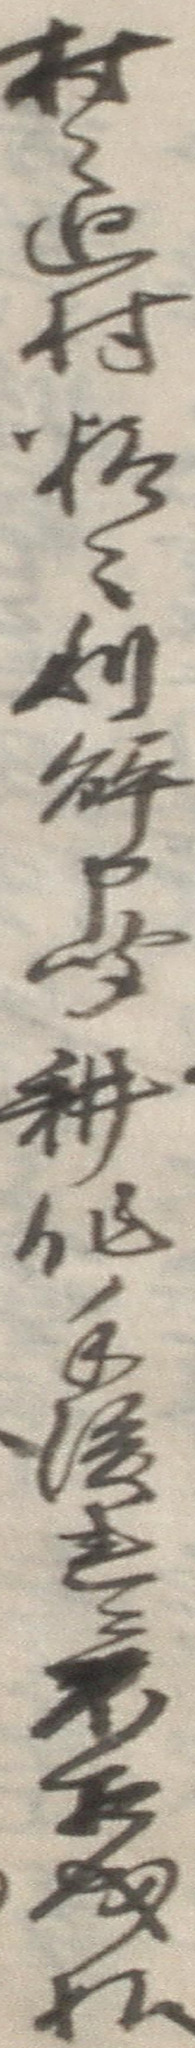村々廻村精々利解申聞耕作手後れ二不相成様
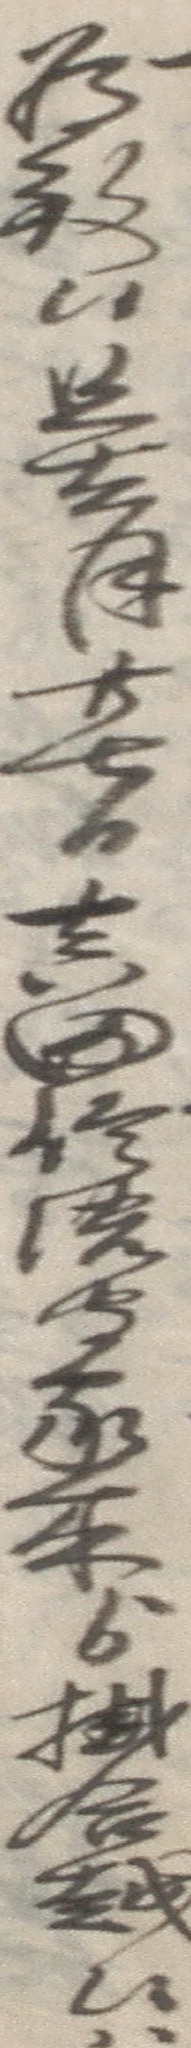為致候且去月廿七日真田信濃守家来ゟ掛合越候ハ
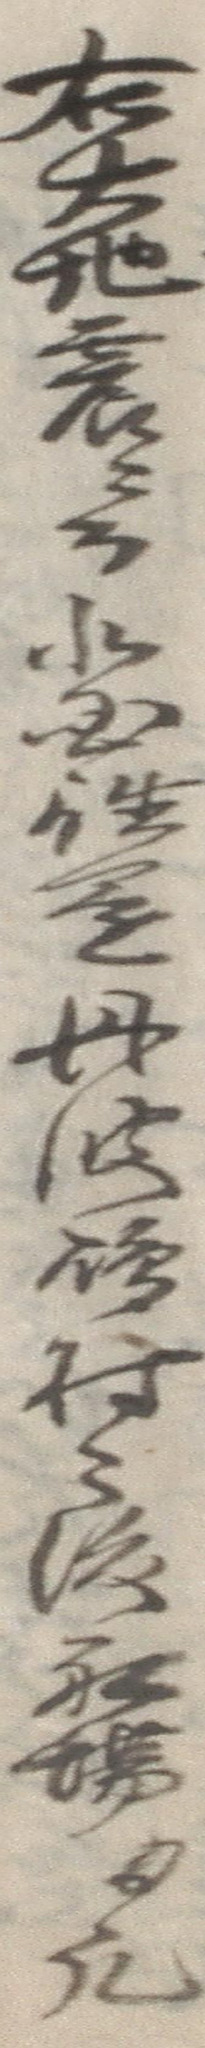右大地震二而北国往還丹波嶋村之渡船場ゟ凡
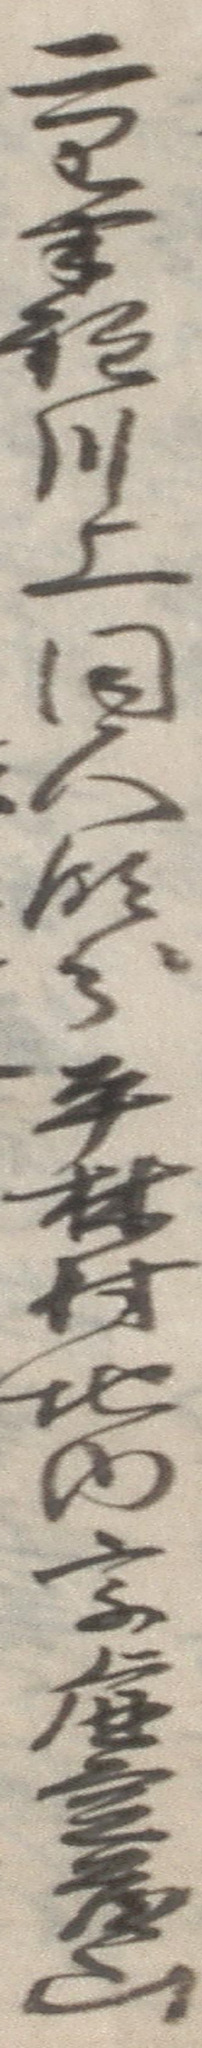二里半程川上同人領分平林村地内字虚空蔵山
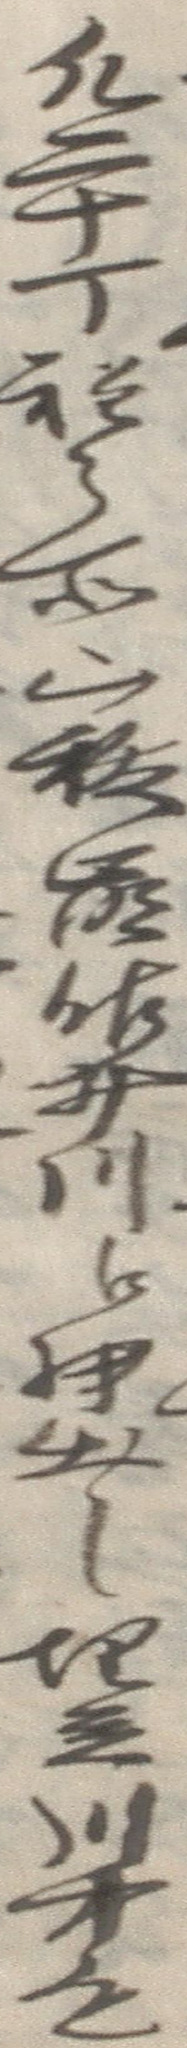凡二十丁程之所山抜崩佐井川江押出埋立川中を
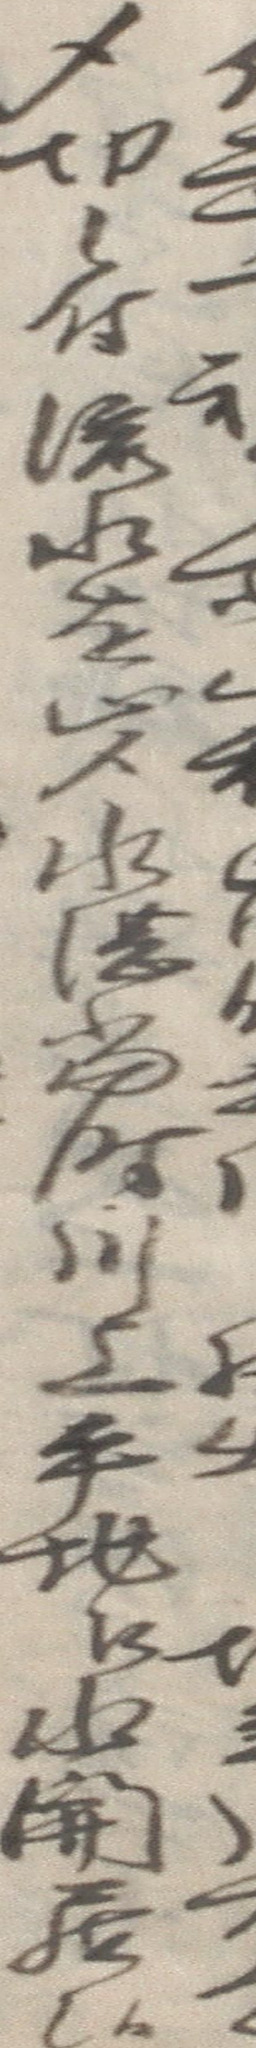〆切候付流水を止メ水湛当時川上平地江水開居候
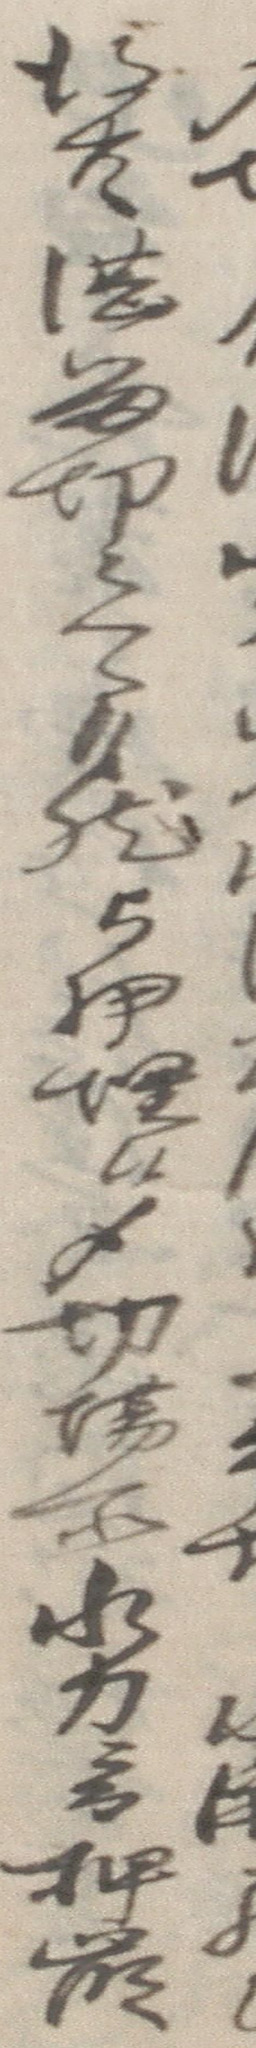得共湛留切二而自然と押埋候〆切場所水力二而押崩
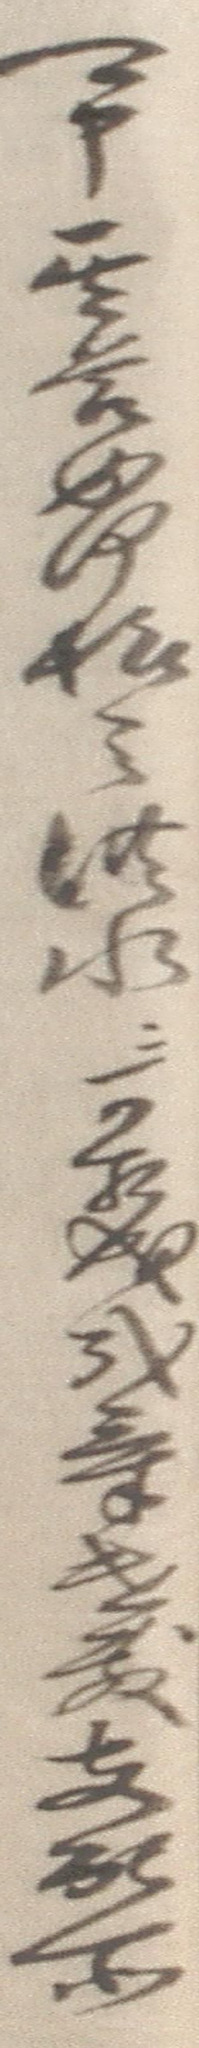可申其節如何様之洪水二可相成哉気遣敷支配所
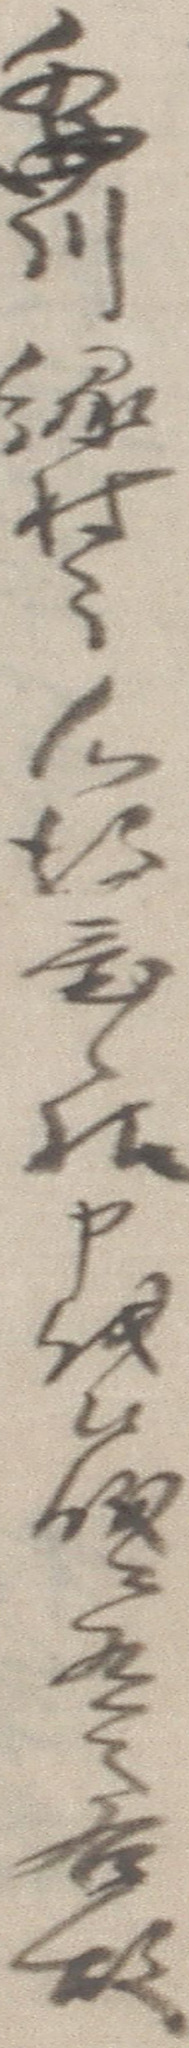千曲川縁村々心得置候様申越候儀二有之右故
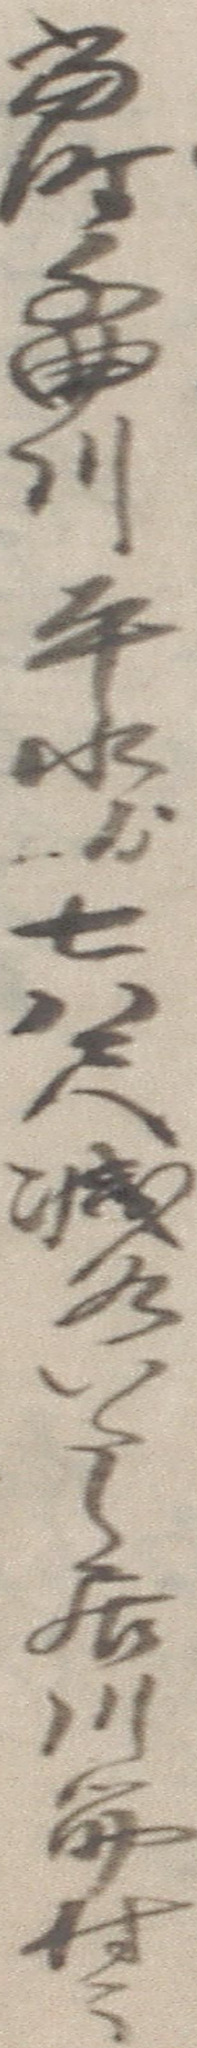当所千曲川平水ゟ七八尺減水いたし居川筋村々
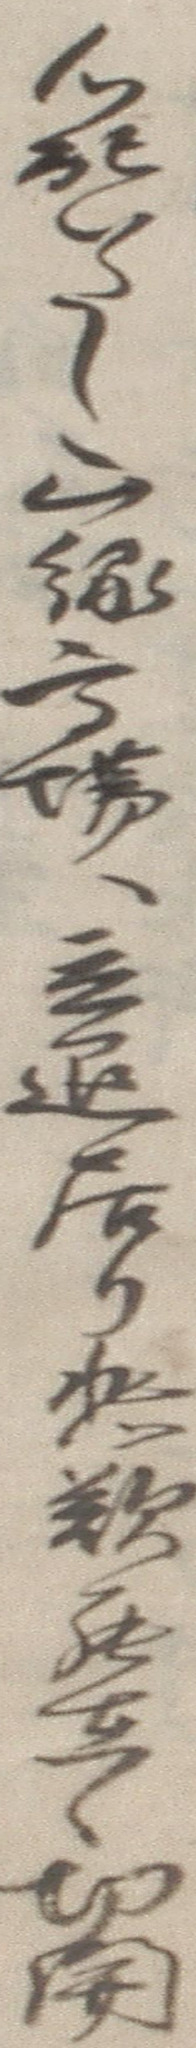心配いたし山縁高場ㇸ立退居り悲歎罷在候切開
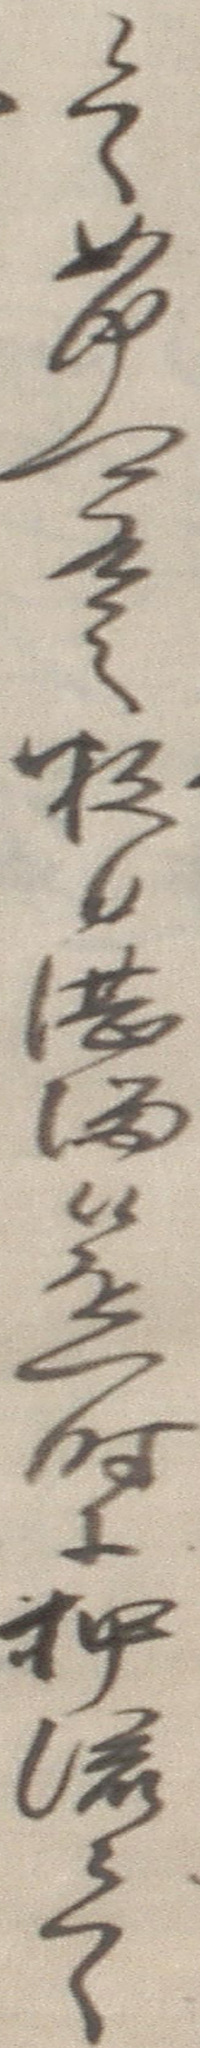候ハゝ如何可有之数日湛溜候を一時に押流候ハゝ
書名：信州地震一件
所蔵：東京大学地震研究所図書室 Earthquake Research Institute Library, The University of Tokyo, JAPAN
